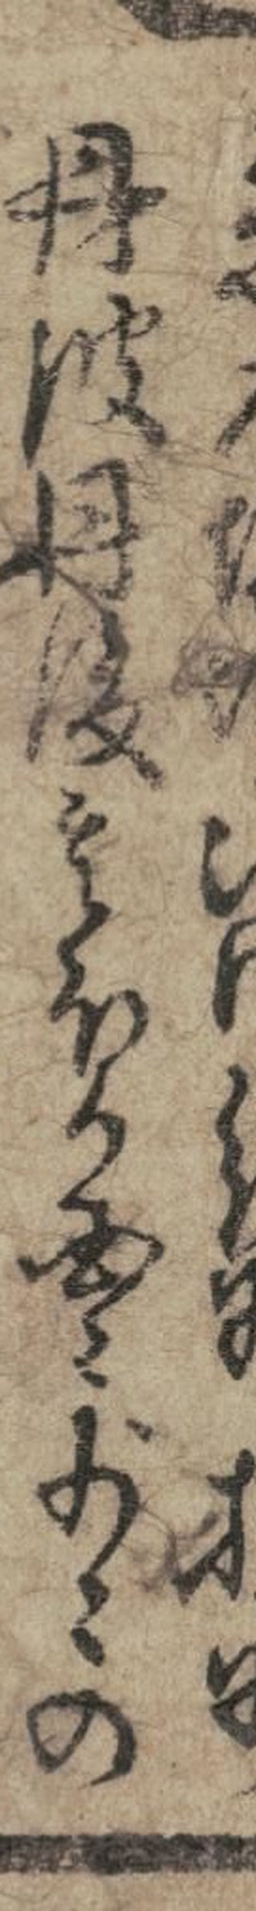丹波丹後其ほか国々少々の
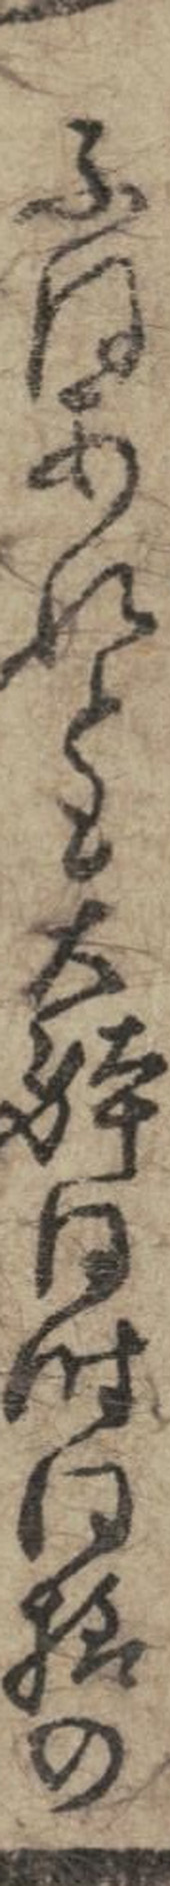不同あれとも大躰同時同様の
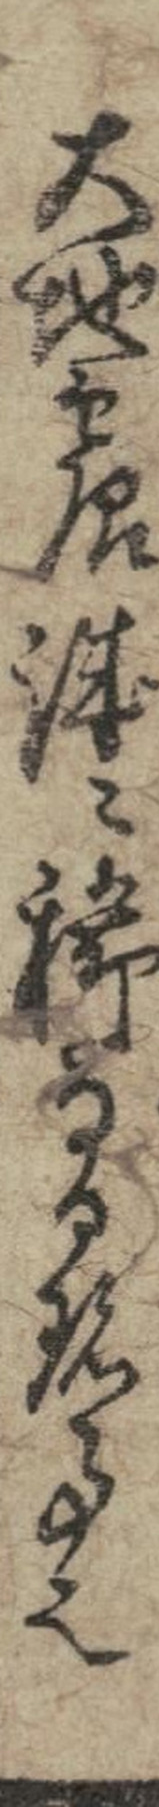大地誠ニ稀なる珍事也
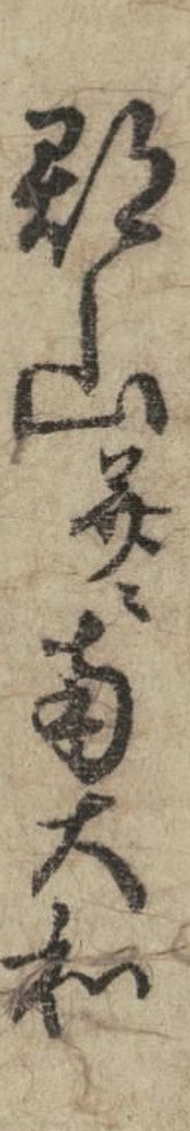郡山幷ニ南大和
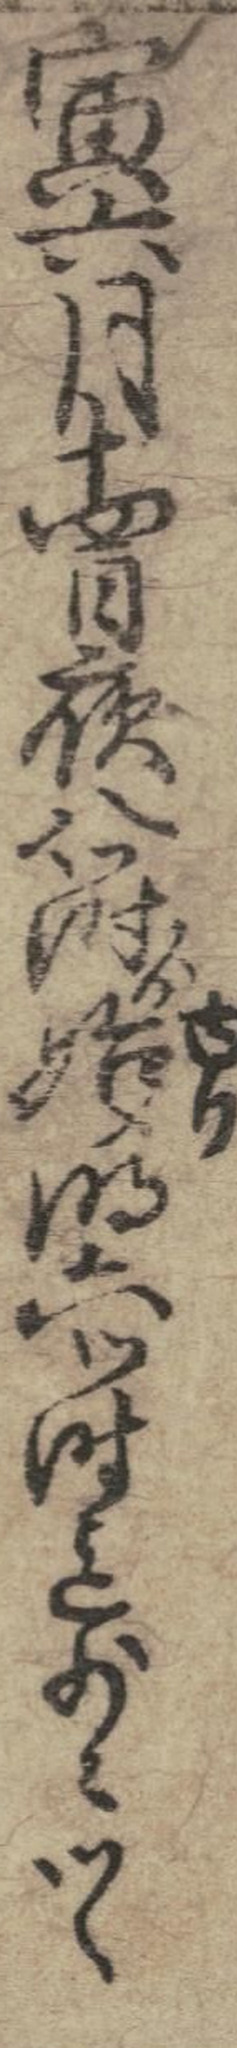寅六月十四日夜八ツ時ゟゆり始明六ツ時迄少々ツゝ
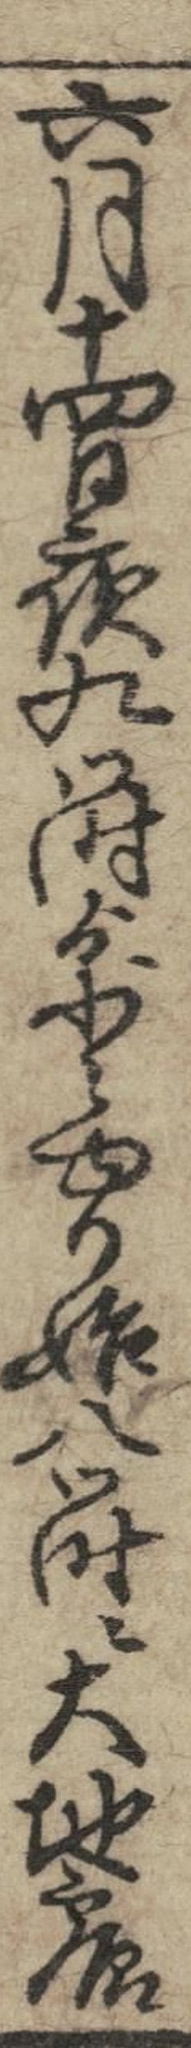六月十四日夜九ツ時ゟ少々ゆり始め八ツ時に大地震
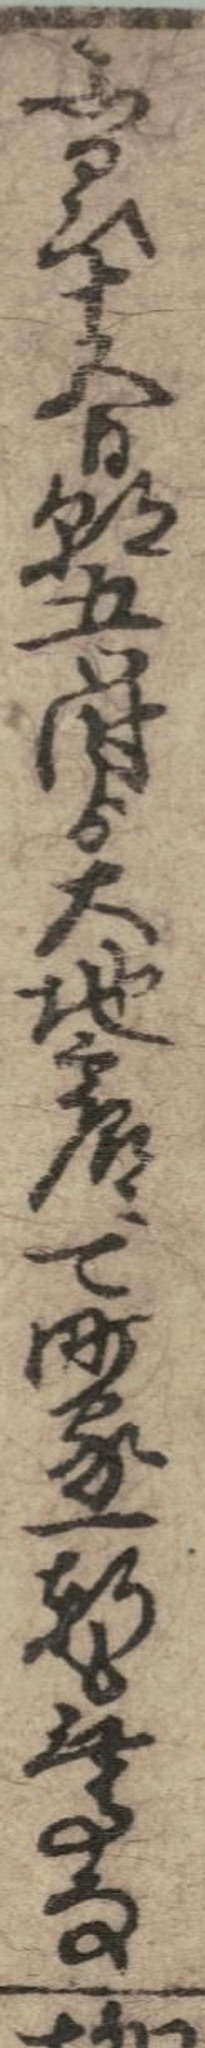ふるひ十五日朝五ツ時ゟ大地震にて町家一軒も無事な
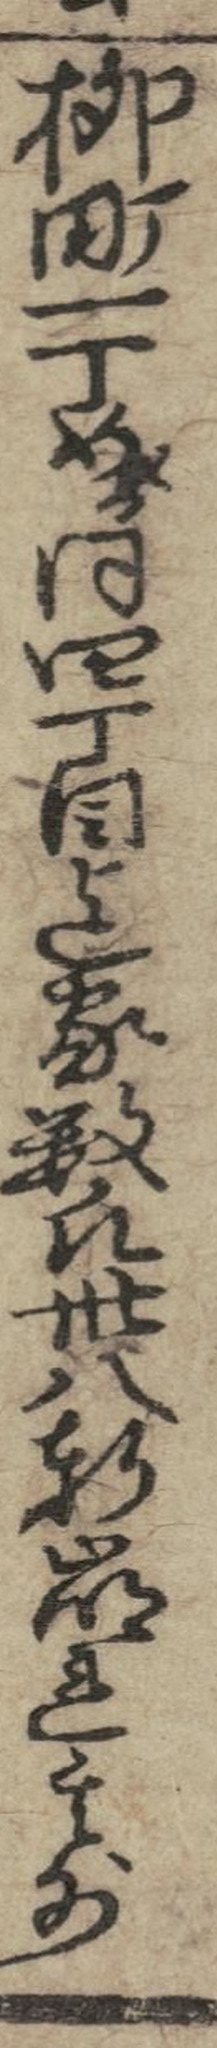柳町一丁めゟ同四丁目迄家数凡卅八九軒くつれ其外
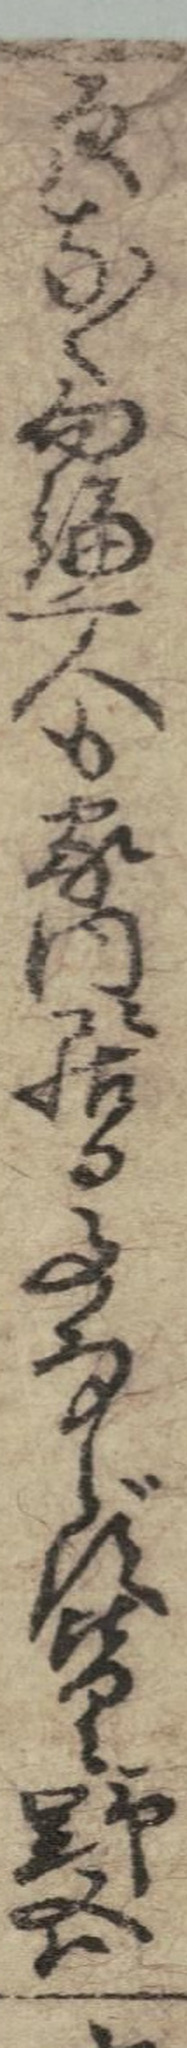る家々勿論一人も家内に居る事ならず皆々野又は
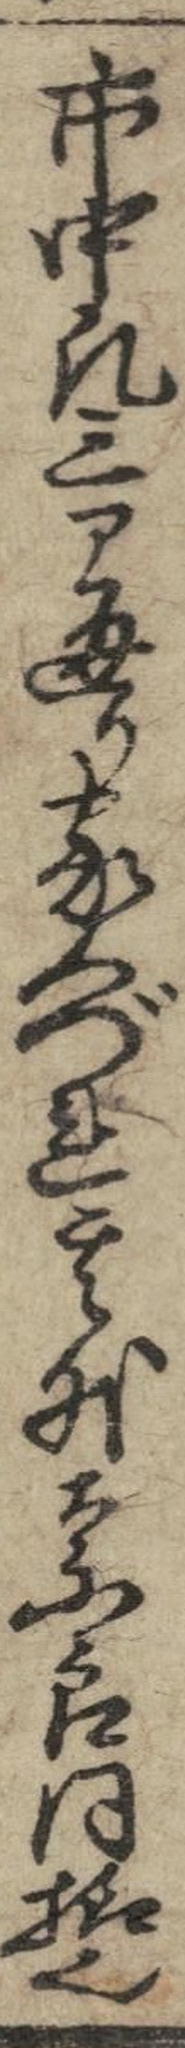市中凡三部通り家くづれ其外奈良同様也
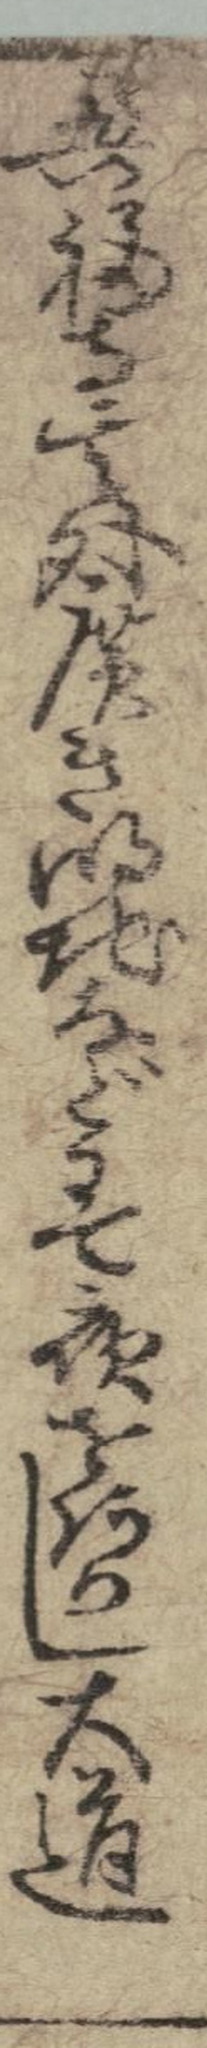興福寺其外広き明地などにて夜をあかし大道
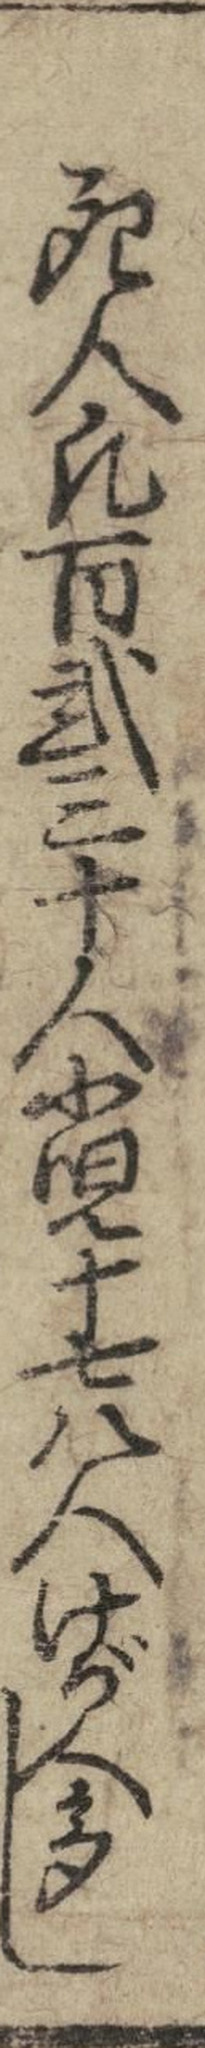死人凡百弐三十人小児十七八人けか人多し
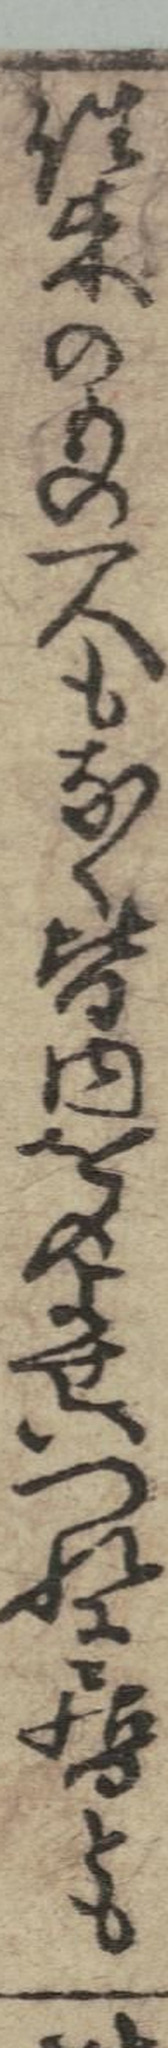往来のもの一人もなく皆門を〆よせいつれに居とも
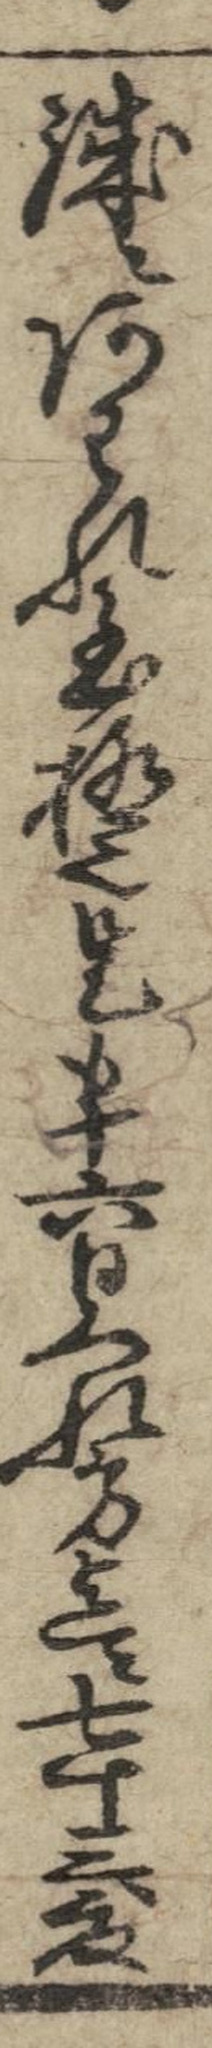誠にあわれ至極也是も十六日くれ方迄に七十三度
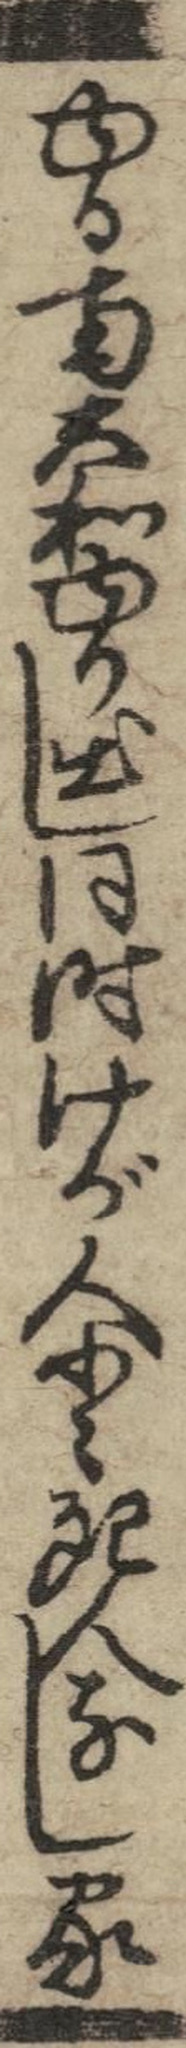ゆる南大和ゆり出し同時けが人少々死人なし家
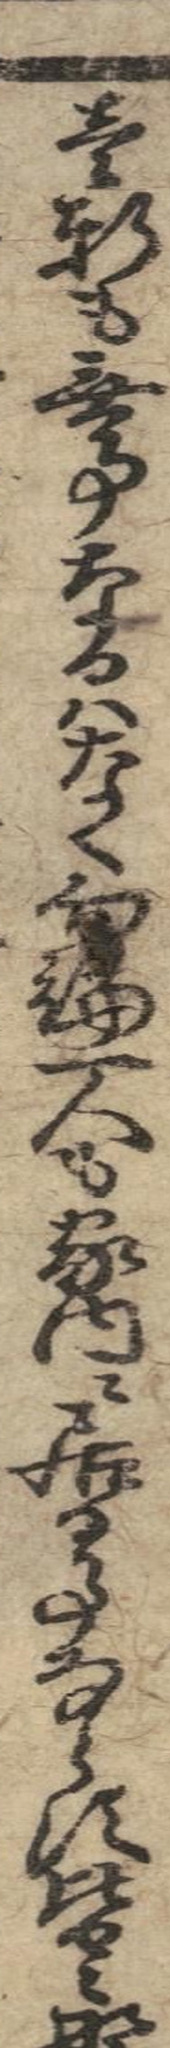壱軒も無事なるはなく勿論一人も家内に居る事ならす皆〻野
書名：聞書　諸國大地震并ニ出火・早飛脚廻りにてくわしき所本しらべ　大地震・山城勢州大和三河江州越前　聞書　大地震並ニ出火の次第
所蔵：東京大学地震研究所図書室 Earthquake Research Institute Library, The University of Tokyo, JAPAN
